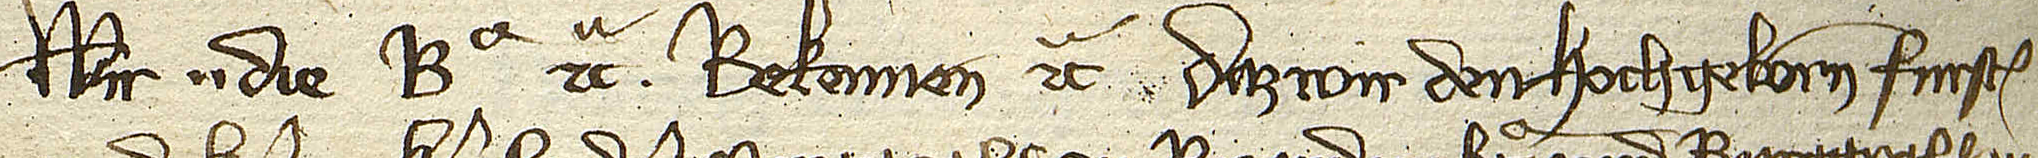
Wir ~ die B* ec* . Bekennen ec* . Daʒ wir den Hochgeborn* furſt
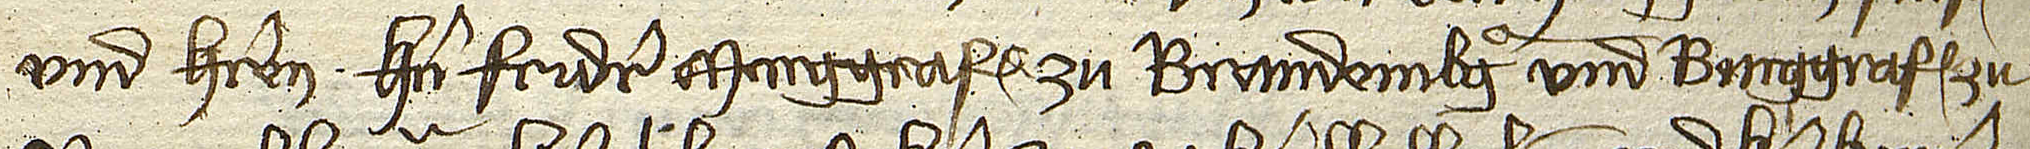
vnd h*ren . H*n fridr* Marggraf* ʒu Brandemb*g vnd Burggraf* ʒu
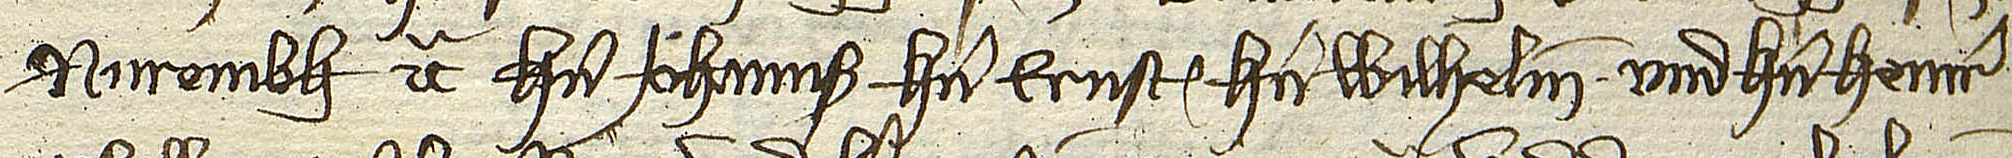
Nuremb*g ec* H*n Iohannſ* h*n Ernſt* h*n Wilhelm* . vnd h*n heinr*
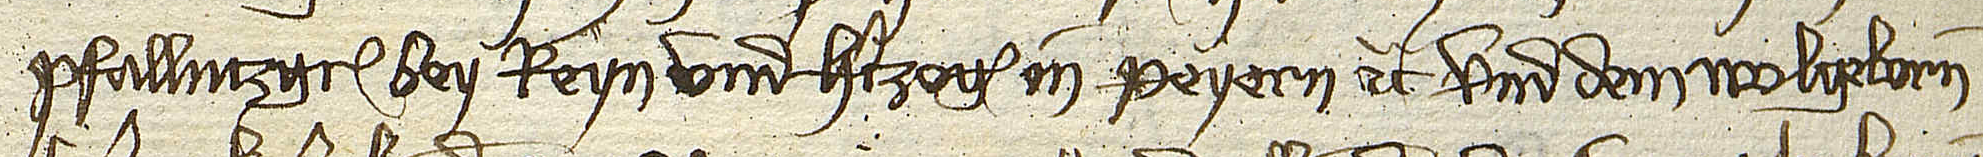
pfallncʒgr* bey Reyn Vnd h*cʒog* in Peyern ec* Vnd dem wolgeborn*
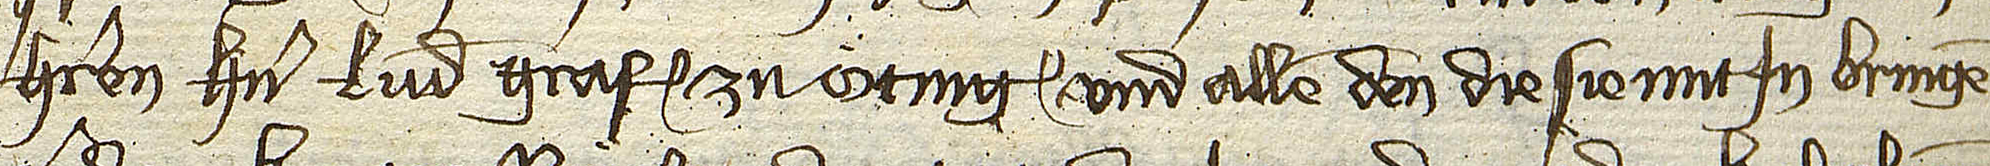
h*ren h*n Lud* graf* ʒu Öting* vnd alle* den die ſie mit In bringe*
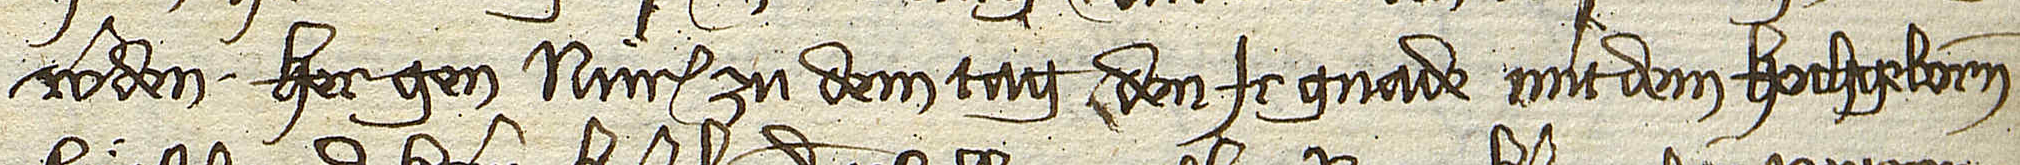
w*den . her gen Nür* ʒu dem tag / den Ir gnade mit dem Hochgeborn*
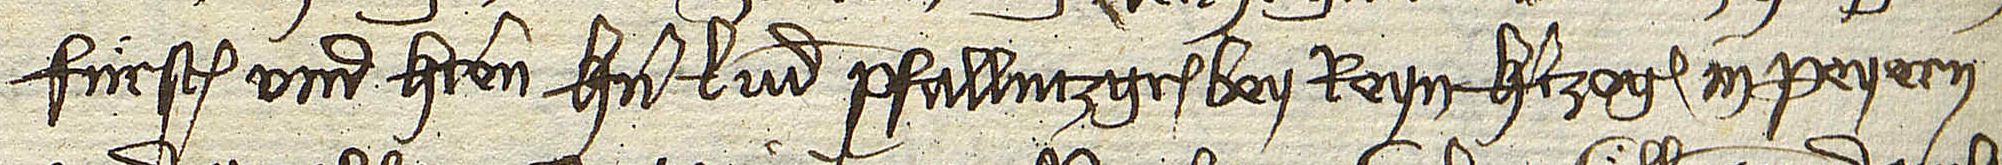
fürſt* vnd h*ren H*n lud* pfallncʒgr* bey Reyn h*cʒog* in Peyern
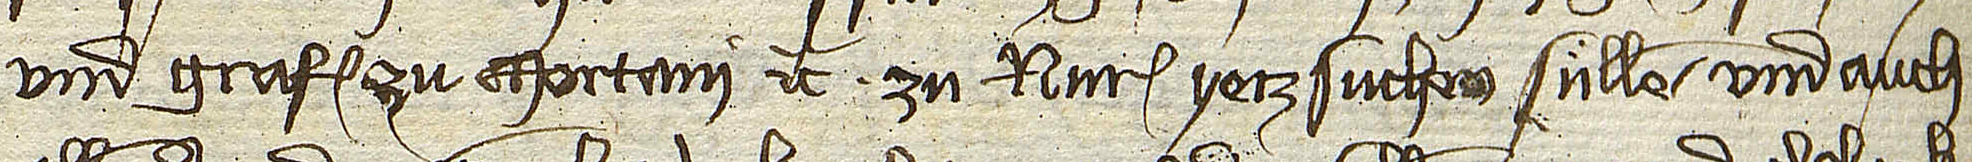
vnd graf* ʒu Mortani ec* . ʒu Nur* yecʒ ſuchen ſülle* / vnd auch
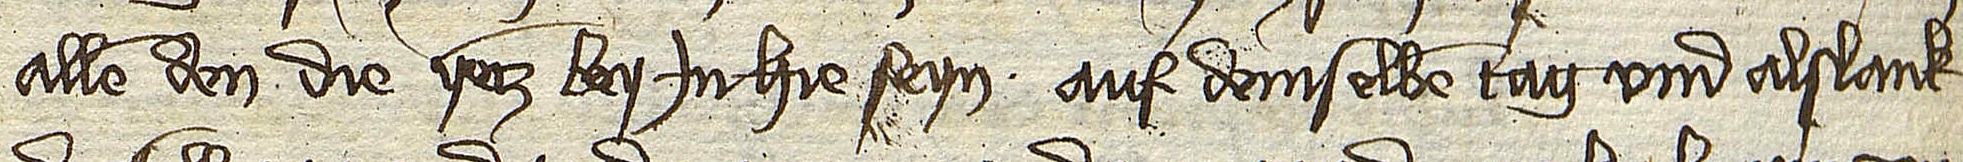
alle* den die yecʒ* bey In hie ſeyn . auf demſelbe* tag vnd alſlank
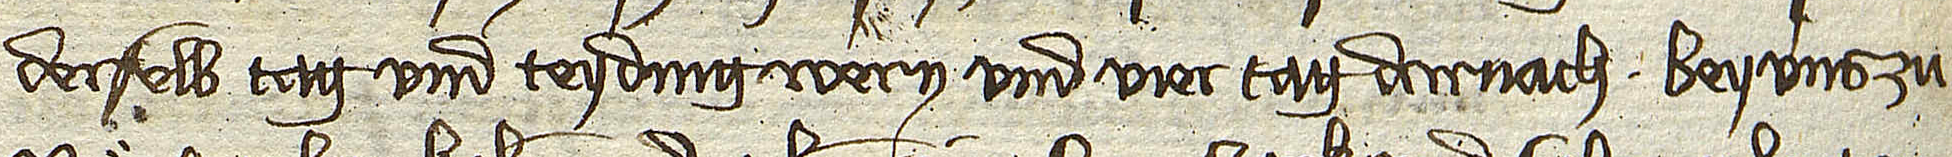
derſelb tag vnd teyding wern vnd vier tag darnach . bey vns ʒu
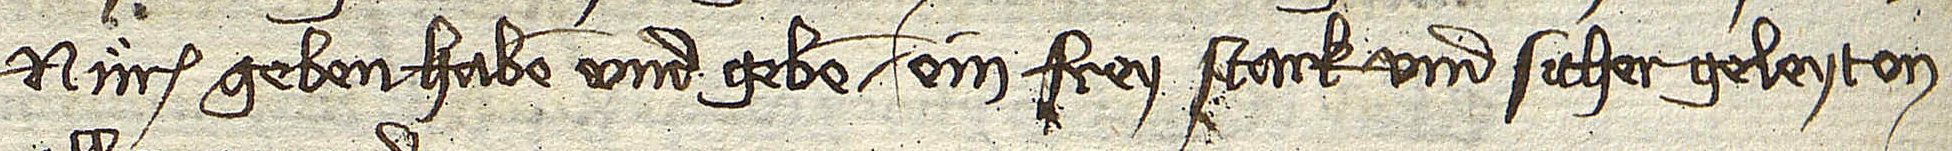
Nür* geben habe* vnd gebe* / ein frey ſtark vnd ſicher geleyt on
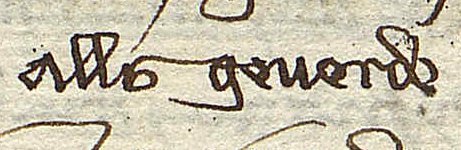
alls geuerde
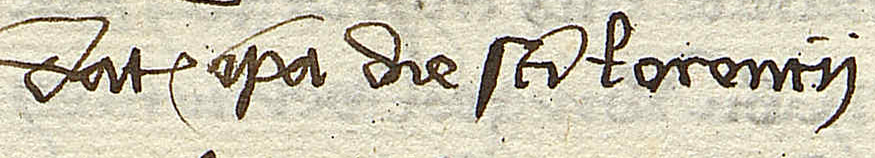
Dat* ipa* die ſci* lorencii
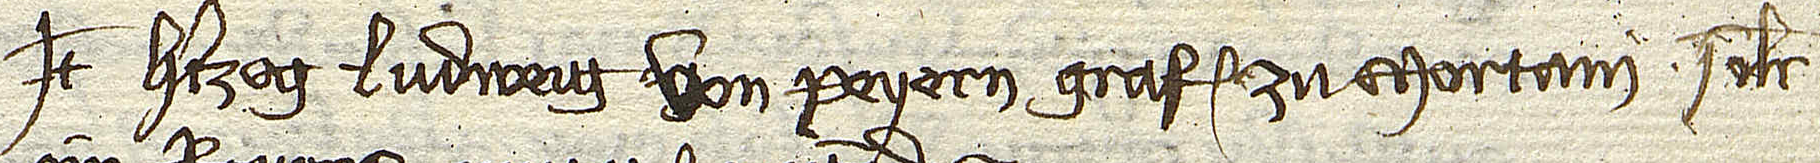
It* h*cʒog ludweig Von Peyern graf* ʒu Mortani . ſilr*
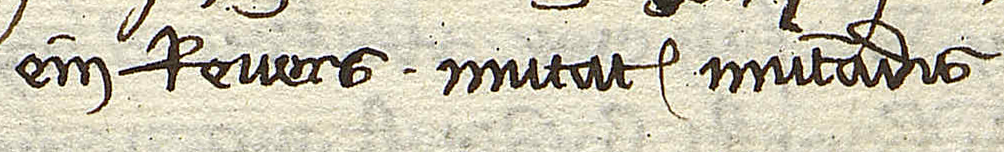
ein Reuers . mutat* muta*dis
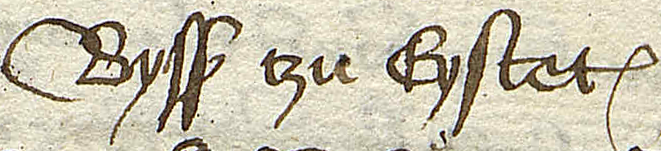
Byſſ* cʒu Eyſtet*
